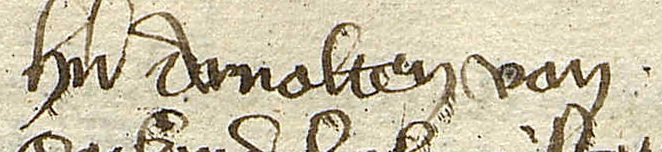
h*n Arnolten von
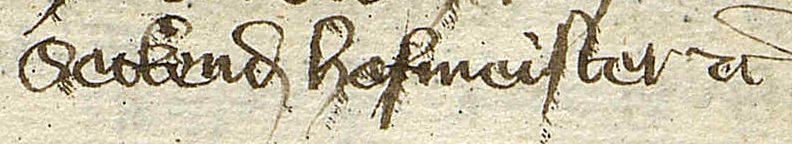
Seckend* hofmeiſter ec*
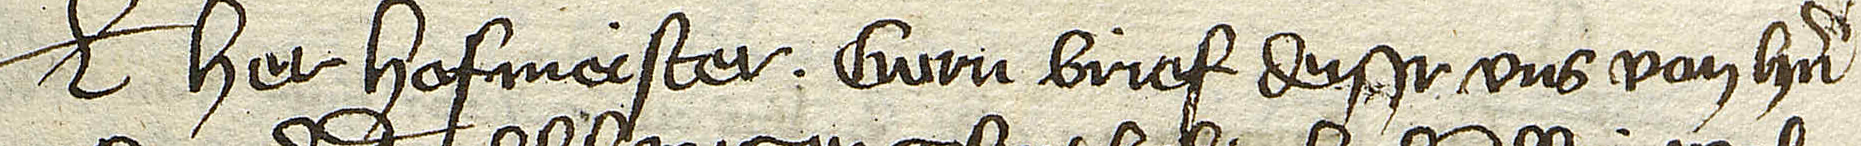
L* her hofmeiſter . Ewrn brief den Ir vns von h*n
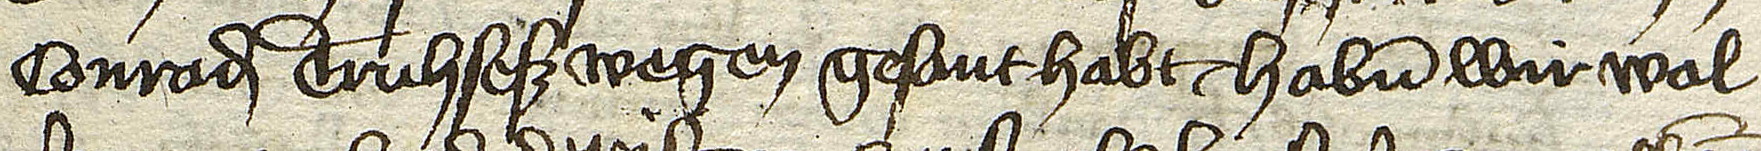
Conrad* Truhſeſʒ wegen geſant habt / hab*n wir wol
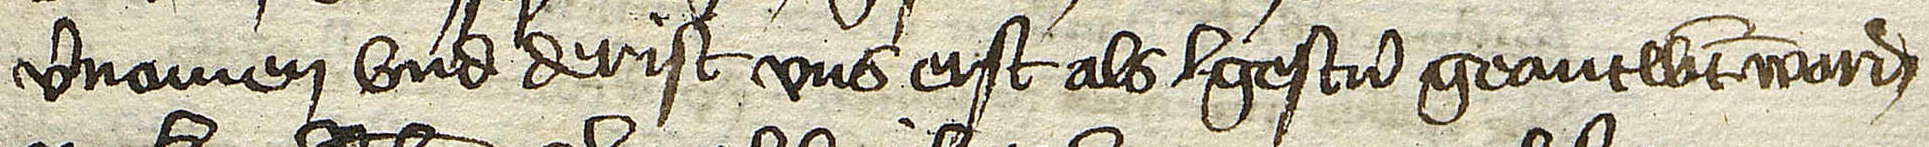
v*nomen vnd der iſt vns erſt als l geſt*n geantw*t word*
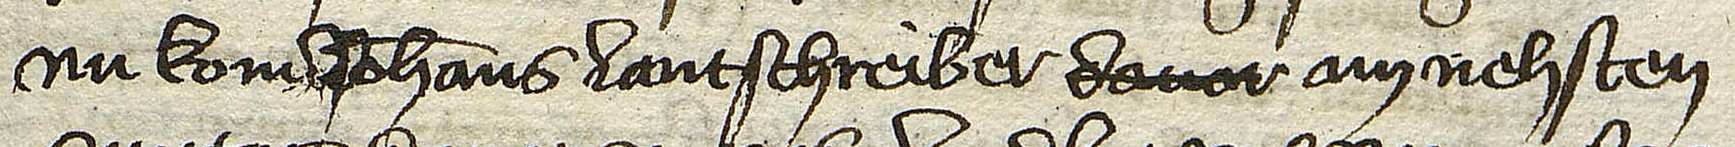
Nu kom* Iohans lantſchreiber dauor am nehſten
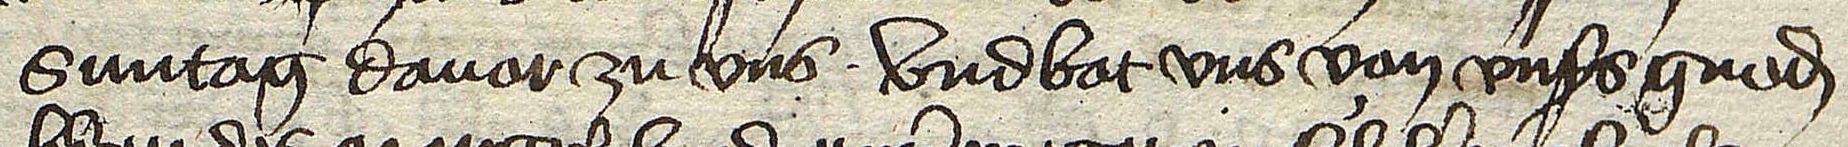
Suntag dauor ʒu vns . Vnd bat vns von vnſ*s gnad*
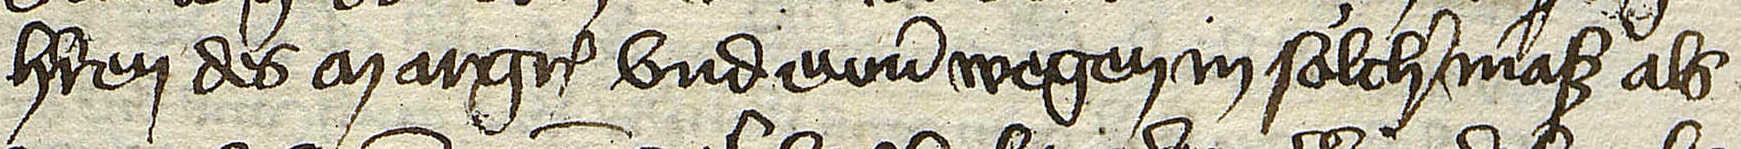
h*ren des Margr* vnd ewn* wegen in ſölch* maſʒ als
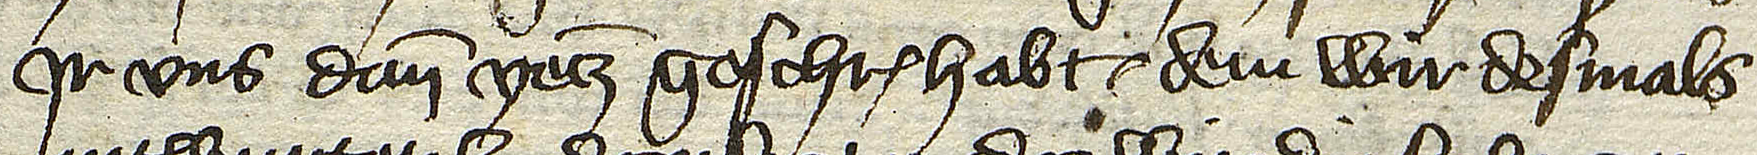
Ir vns dan* yecʒ* geſchr* habt / dem wir deſmals
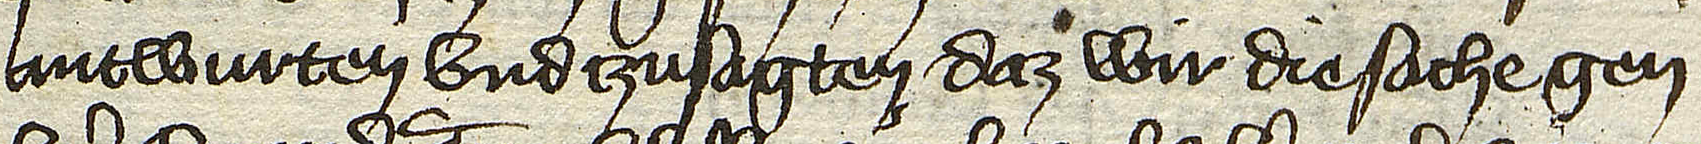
antwurten vnd ʒuſagten / daʒ wir die ſache gen
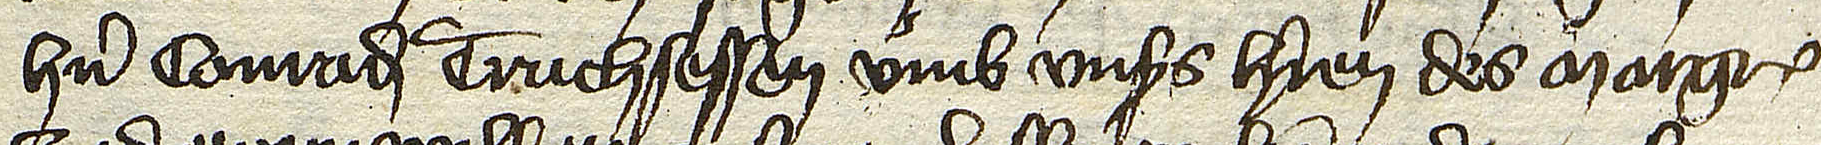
h*n Conrad* Truchſeſſen v̈mb vnſ*s h*ren des Margr*
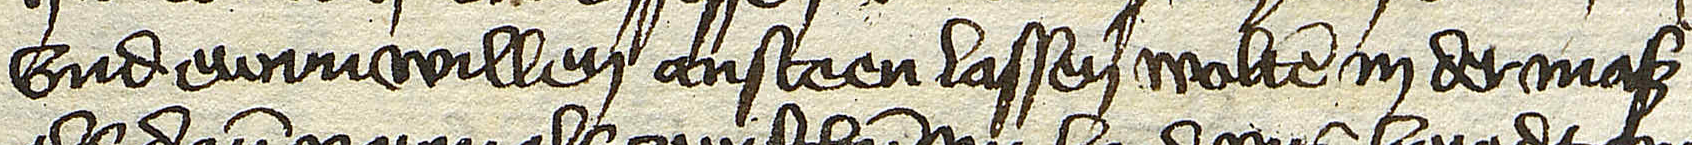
vnd ewrn willen anſteen laſſen wolte* in der maſʒ
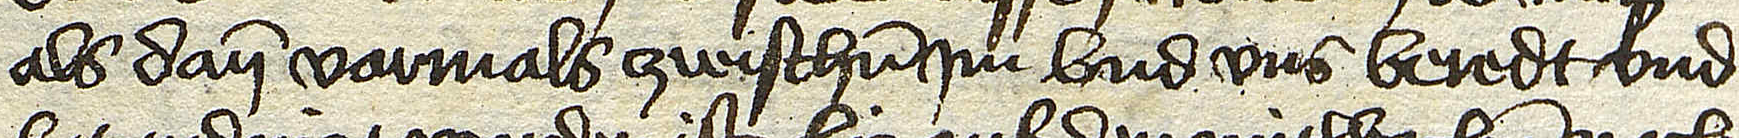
als dan* vormals ʒwiſch*n Im vnd vns beredt vnd
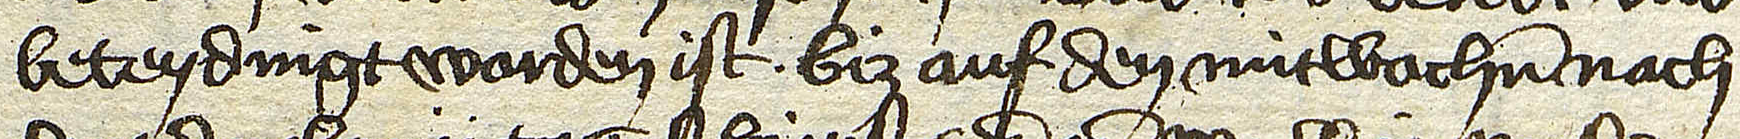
beteydingt worden iſt . biʒ auf den mitwoch*n nach
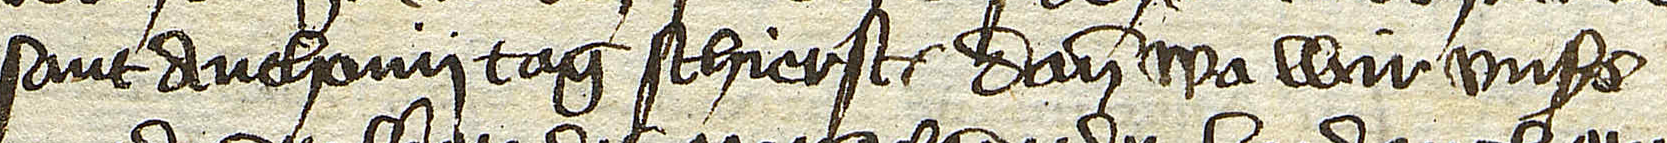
ſant Anthonii tag ſchierſt / Dan* wo wir vnſ*s
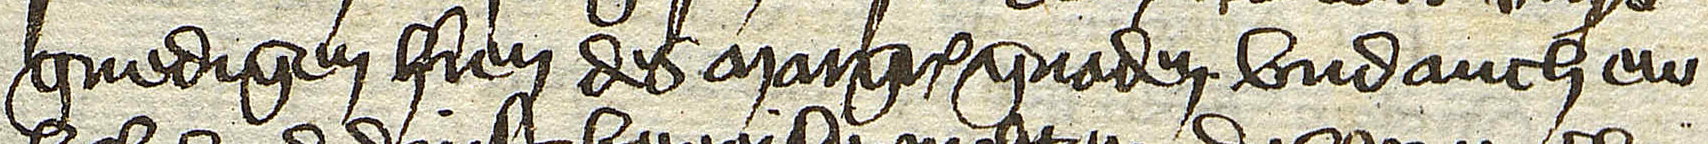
gnedigen h*ren des Margr* gnaden vnd auch ew
